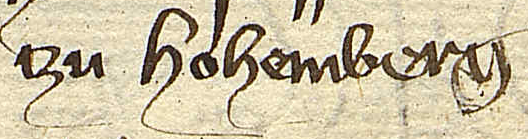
cʒu hohemberg
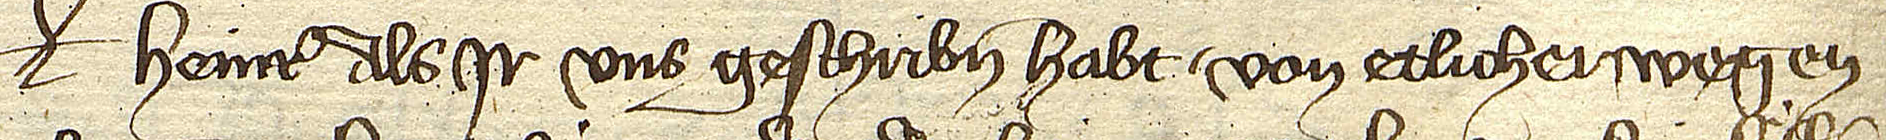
L* heinr* Als Ir vns geſchribn* habt / von etlicher wegen
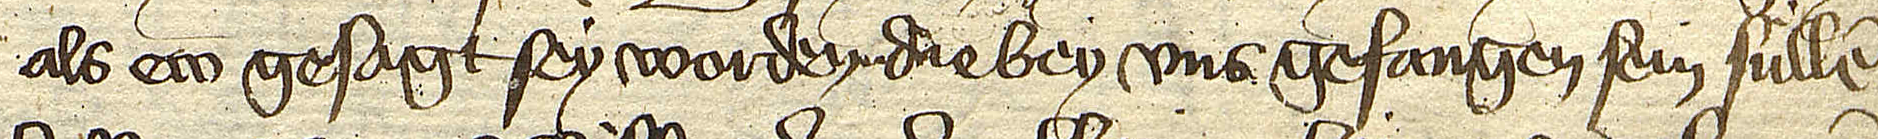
als ew geſagt ſey worden ~ die bey vns gefangen ſein ſülle*
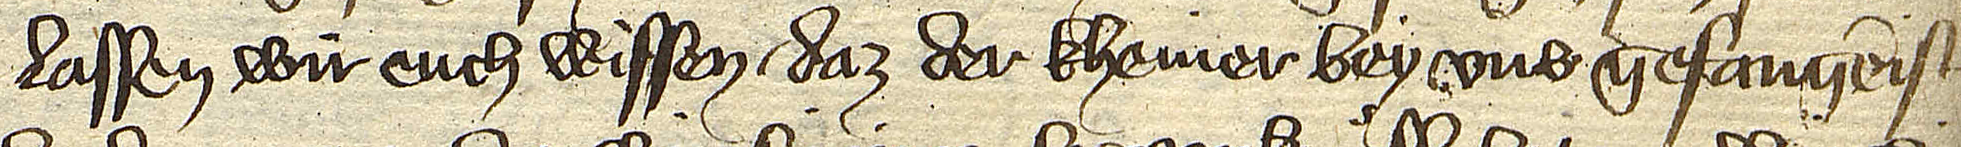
laſſen wir euch wiſſen / daʒ der kheiner bey vns gefange* iſt
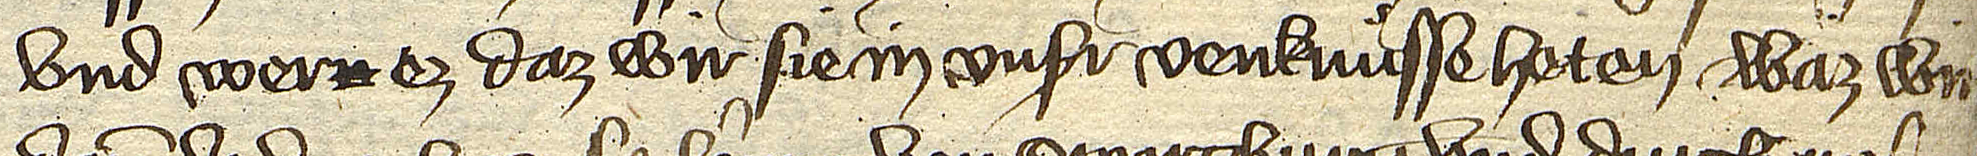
vnd wern eʒ daʒ wir ſie in vnſ*r venknüſſe heten / waʒ wir
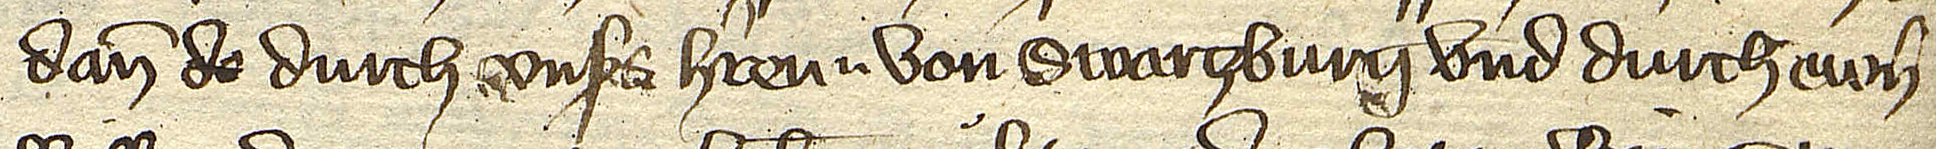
dan* de durch vnſ*s h*ren ~ von Swarcʒburg vnd durch ewn*
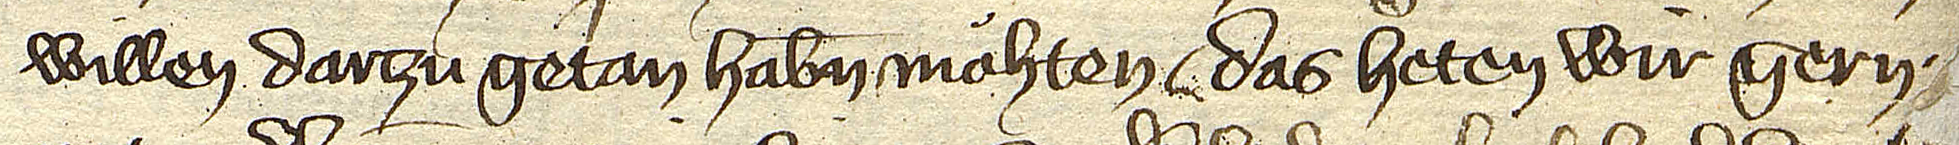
willen darcʒu getan habn* möhten / das heten wir gern
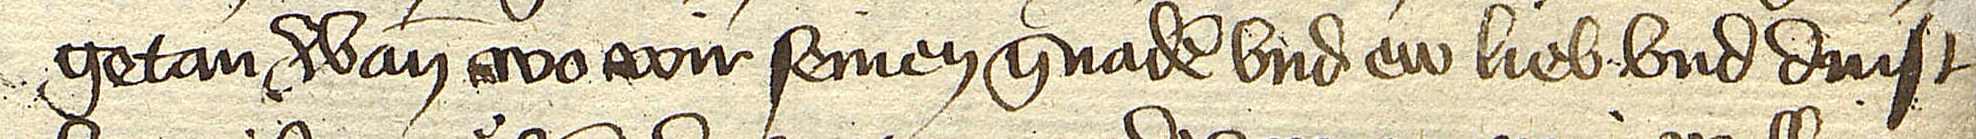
getan / wan wo wir ſeinen gnade* vnd ew lieb vnd dinſt
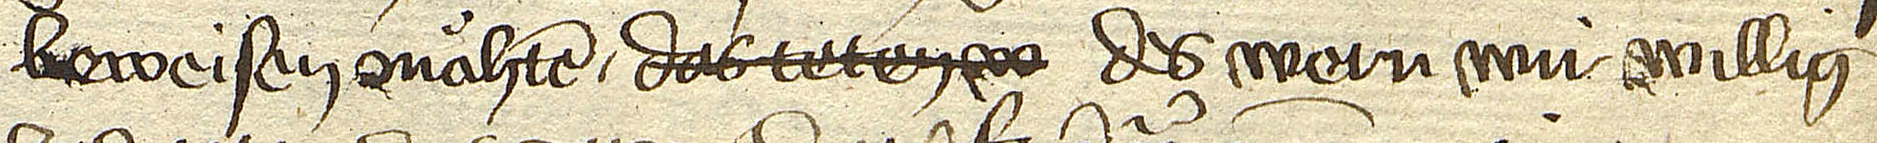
beweiſen möhte* / das teten w des wern wir willig
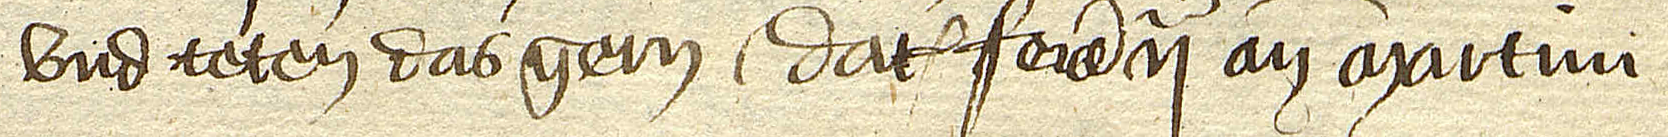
vnd teten das gern / dat* feia* ii* an* Martini
